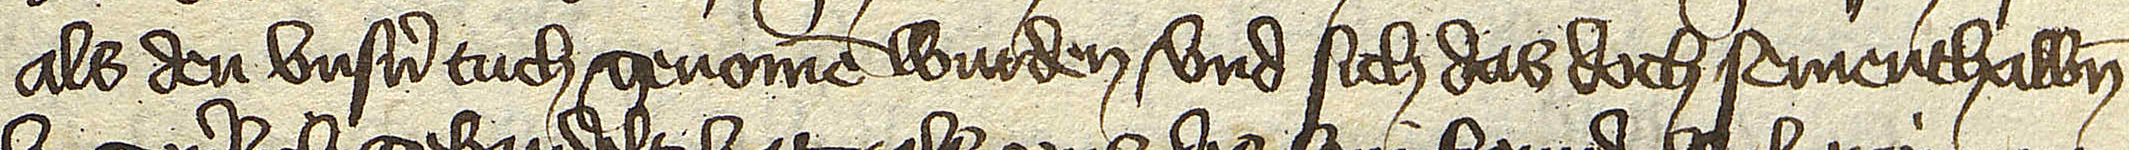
als den vnſn* tuch genome* wurden / vnd ſich das doch ſeinenthalbn*
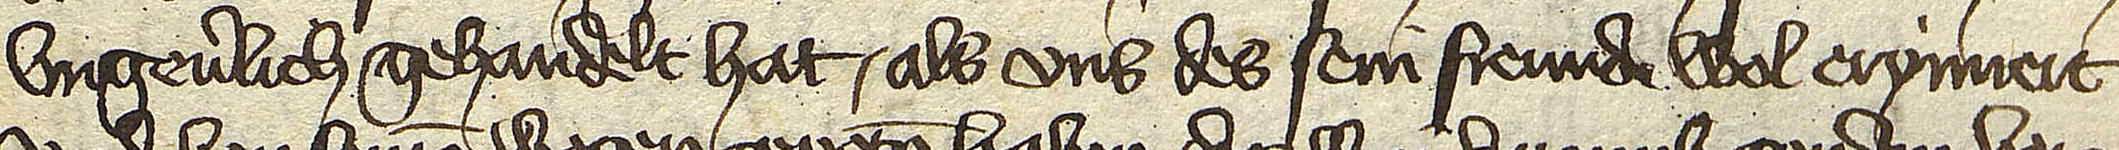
vngeu*lich gehandelt hat / als vns des ſein freunde wol erynnert
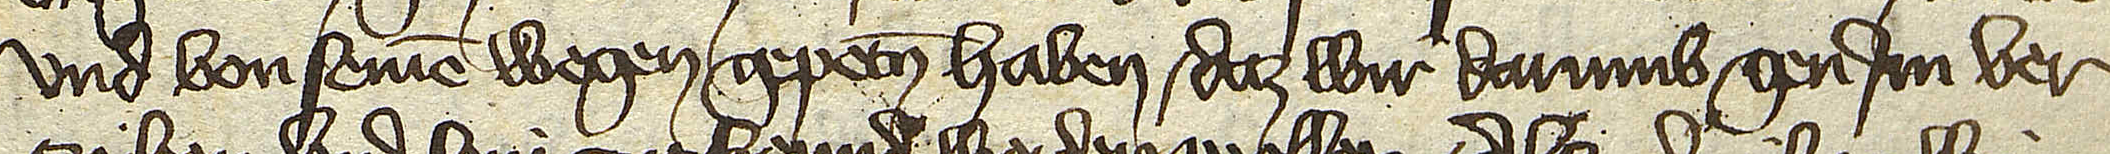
vnd von ſeine* wegen gepetn* haben / daʒ wir darumb gen Im ver
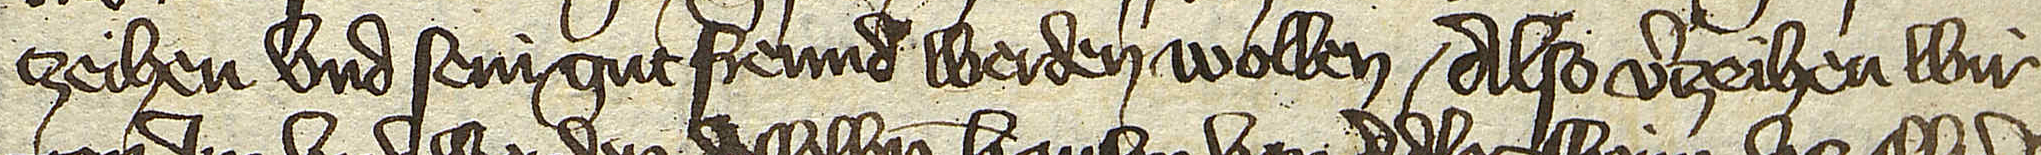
cʒeihen vnd ſein gut freund werden wollen / Alſo v*cʒeihen wir
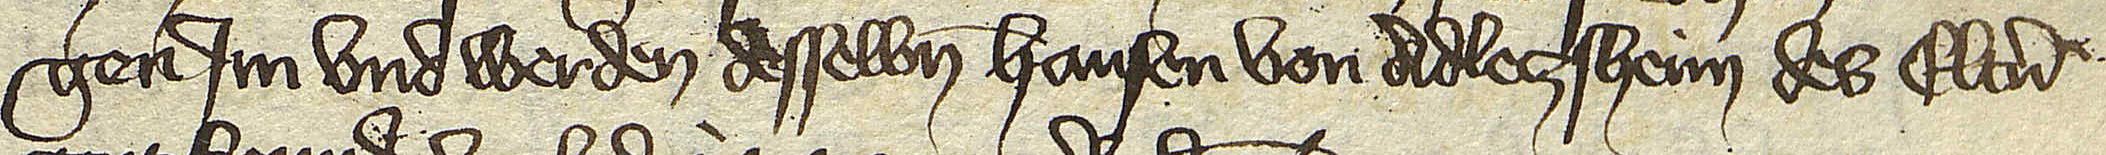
gen Im vnd werden deſſelbn* hanſen von Adlecʒſheim des Eltn*
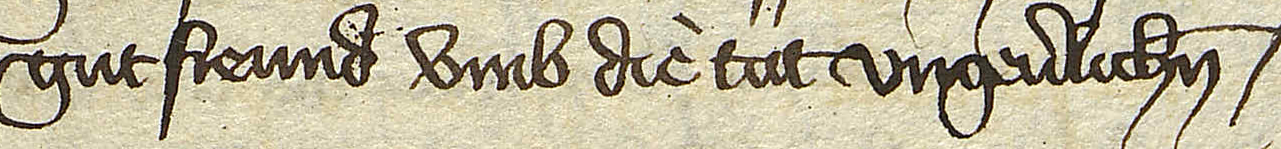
gut freund vmb die tat vngeu*lichn* /
